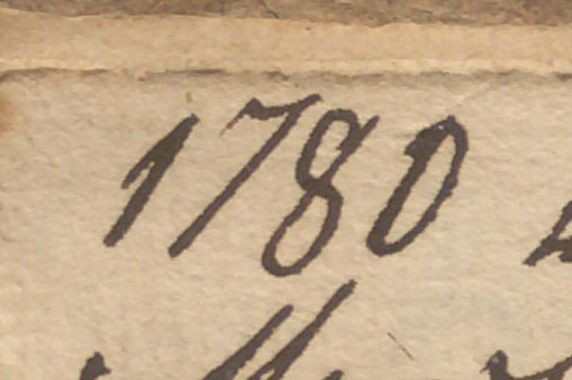1780
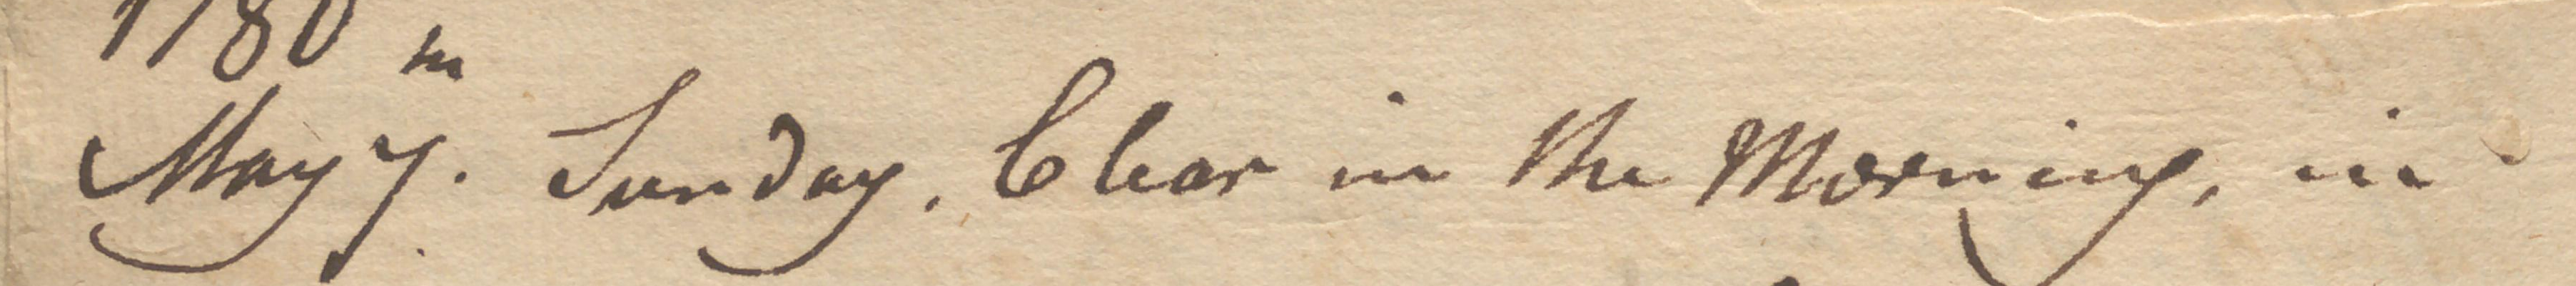May 7^th. Sunday. Clear in the Morning, in
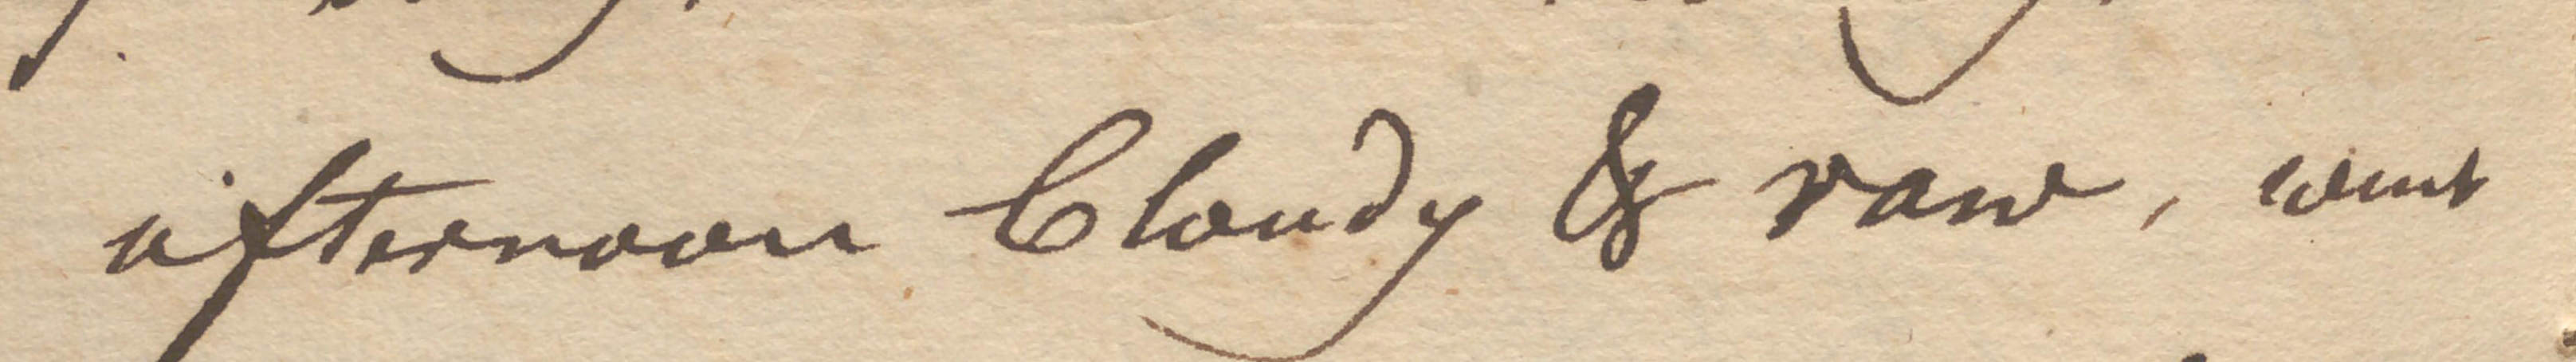afternoon Cloudy & raw, went
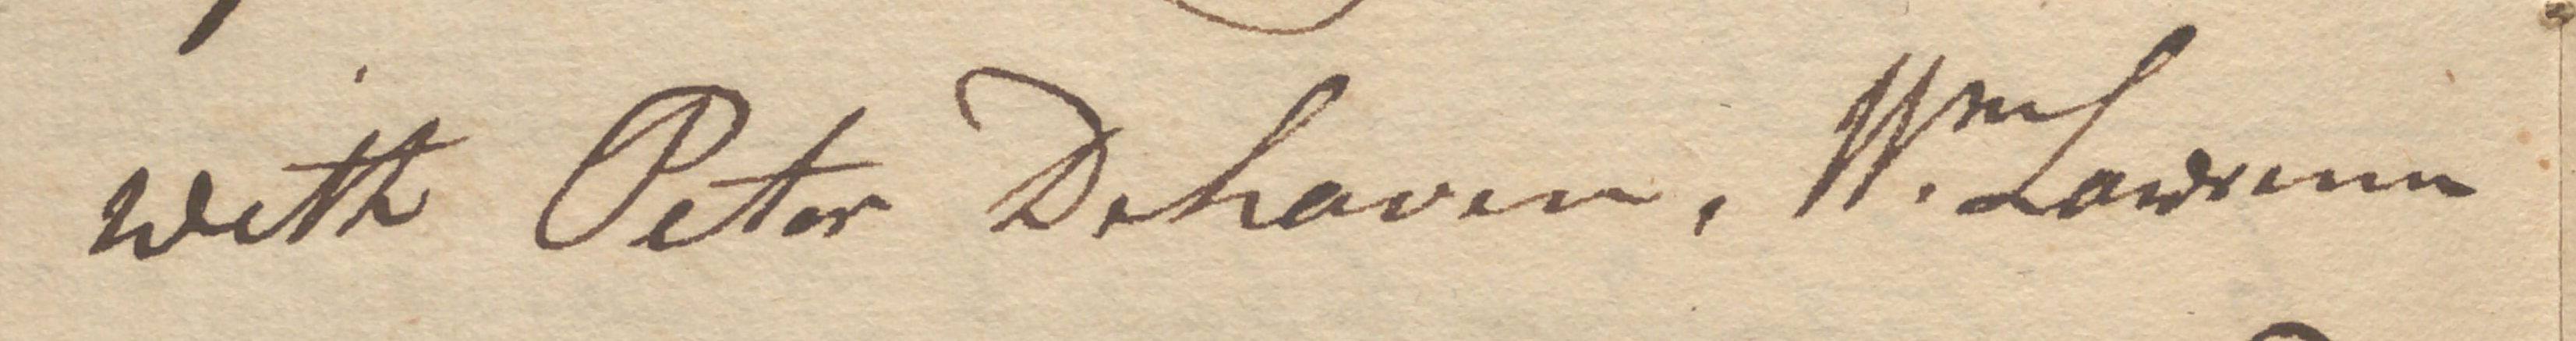with Peter Dehaven, W^m. Lawrence
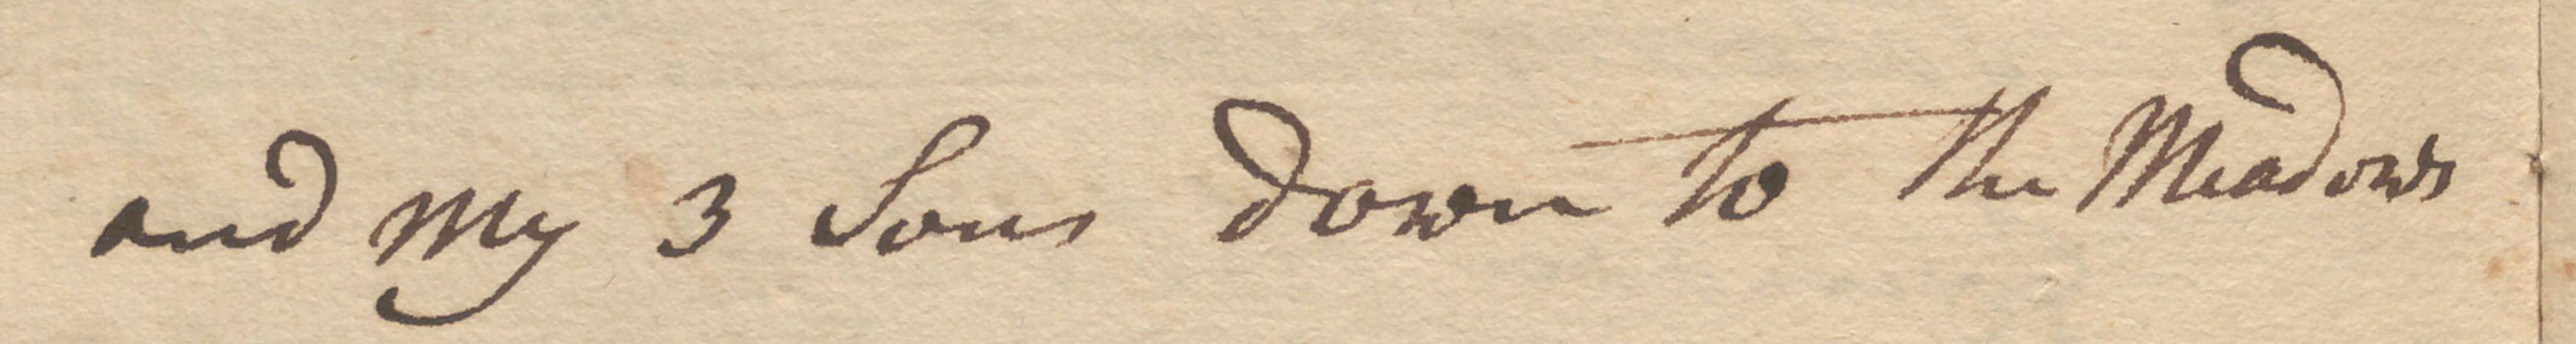and My 3 Sons down to the Meadows
